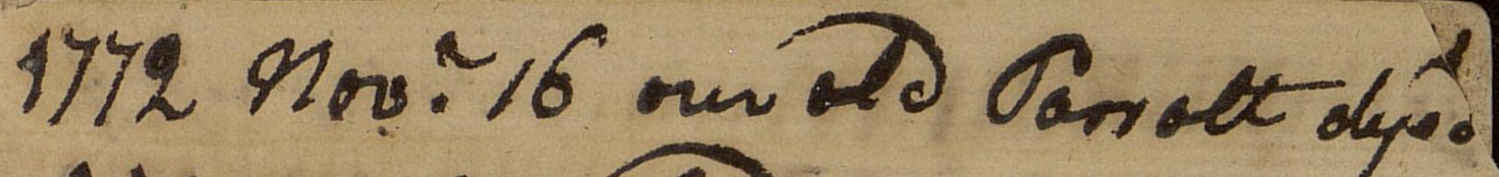1772 Nov^r. 16 our old Parrott [dyed]
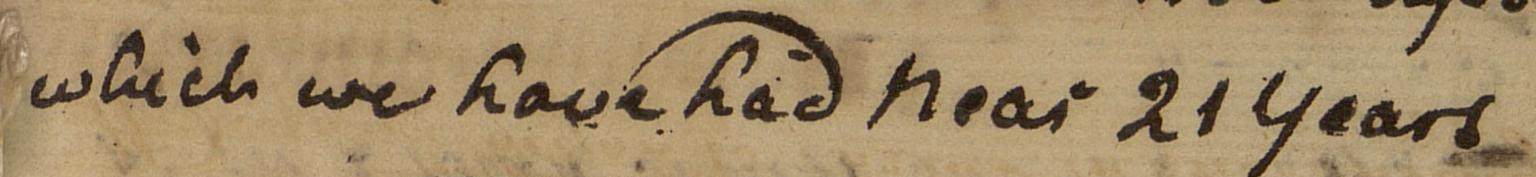which we have had Near 21 Years
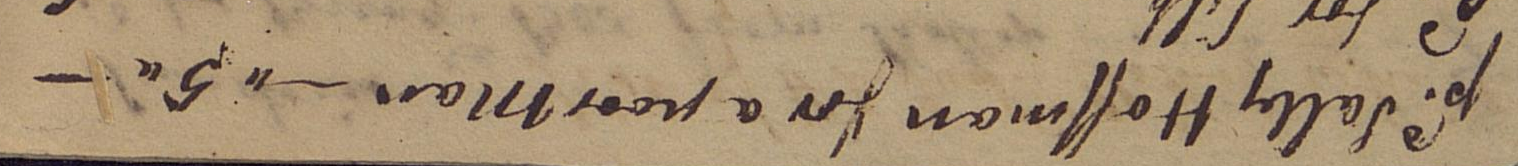p^d. Sally Hoffman for a poor Man- ..5..-
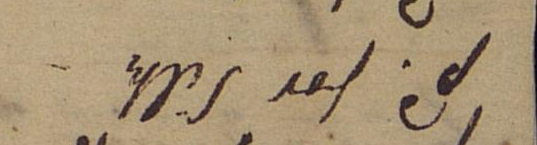p^d. for Silk-
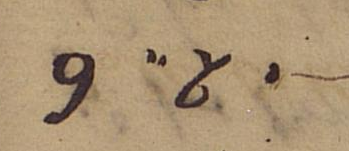-.2. 6
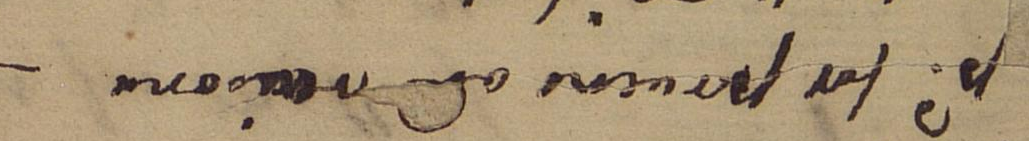p^d. for pruens a[__] raisons-
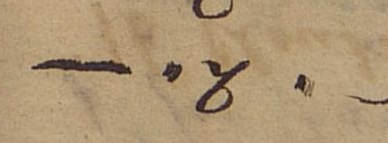..2..-
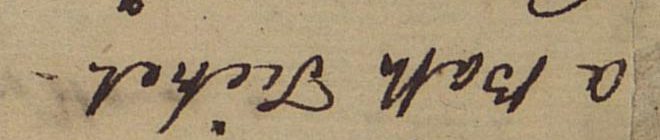a Bath Ticket,-
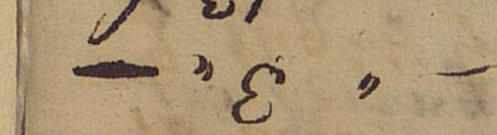- ..3..-
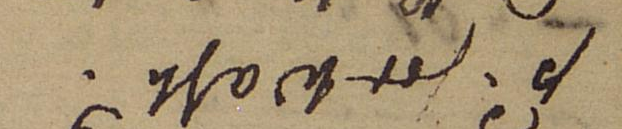p^d. for Wash^g.
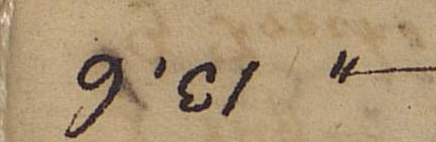..13.6
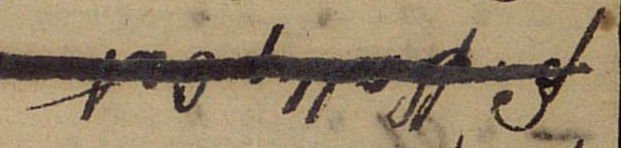[__________]
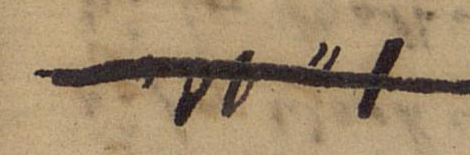[____]
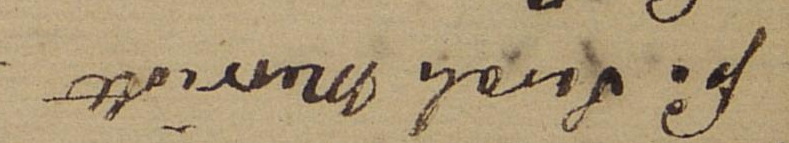p^a. sirals merrist
